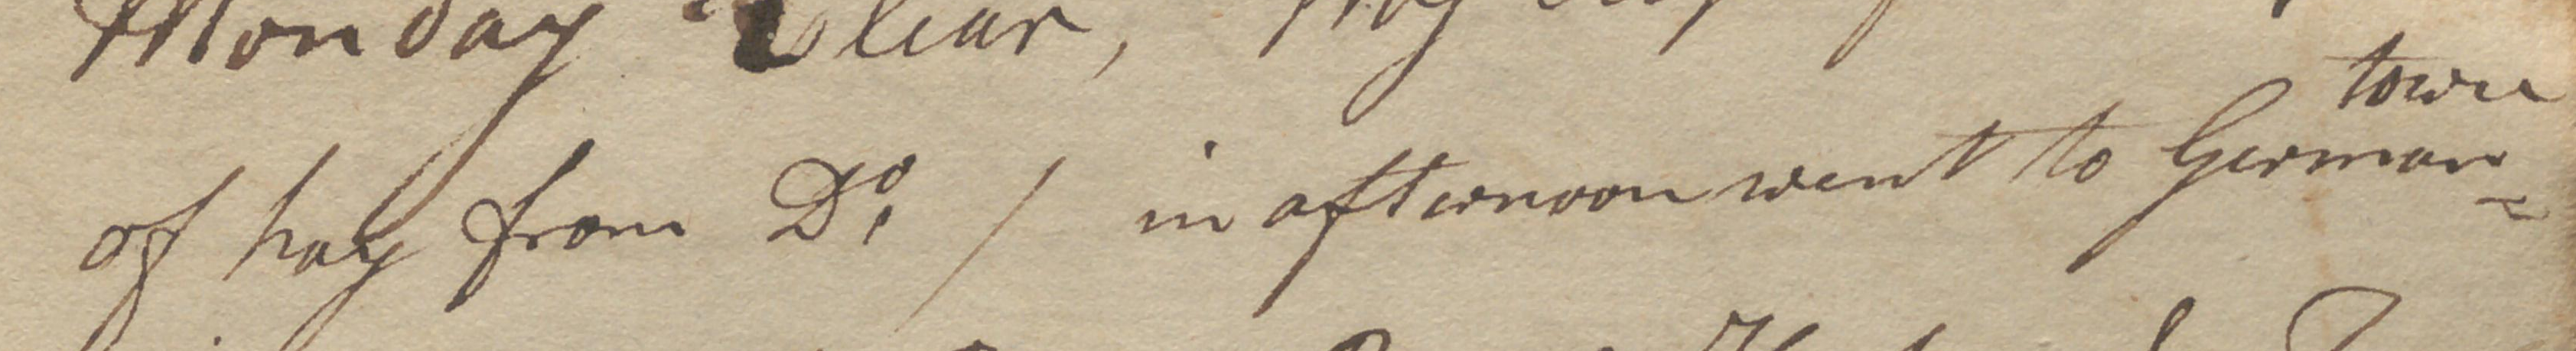of hay from D^o. in afternoon went to German-
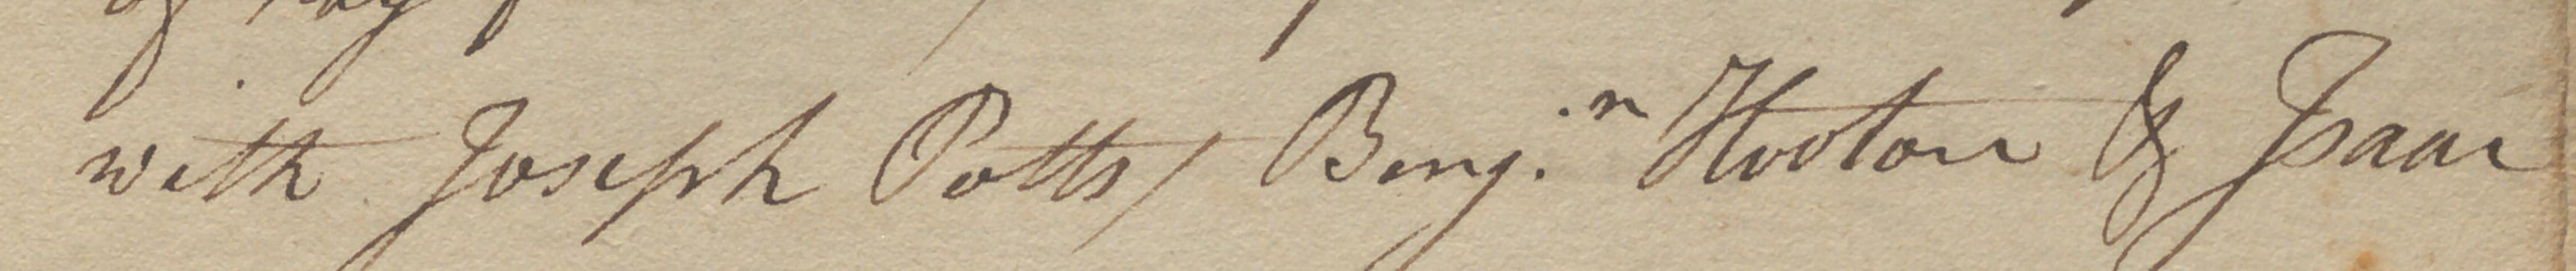with Joseph Potts Benj^n Hooton & Isaac
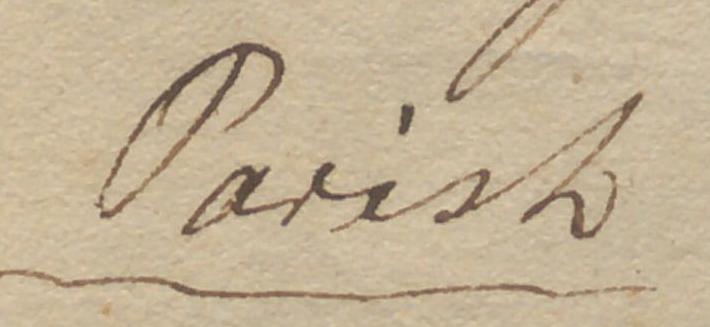Parish
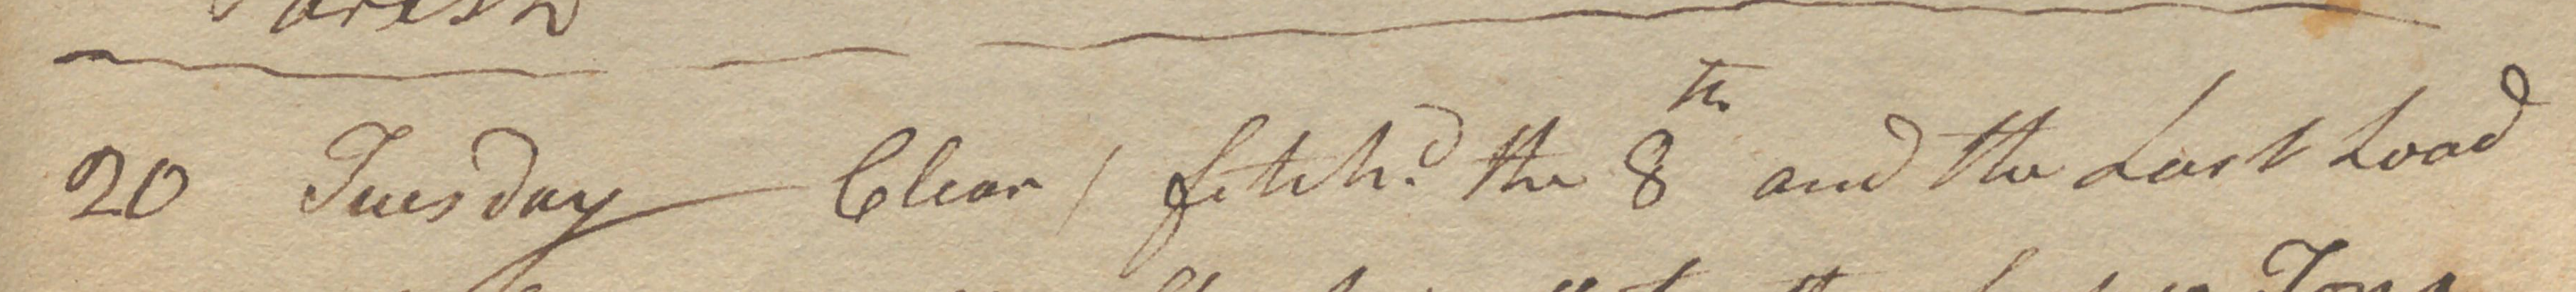20 Tuesday Clear / fetch^d. the 8^th and the Last Load
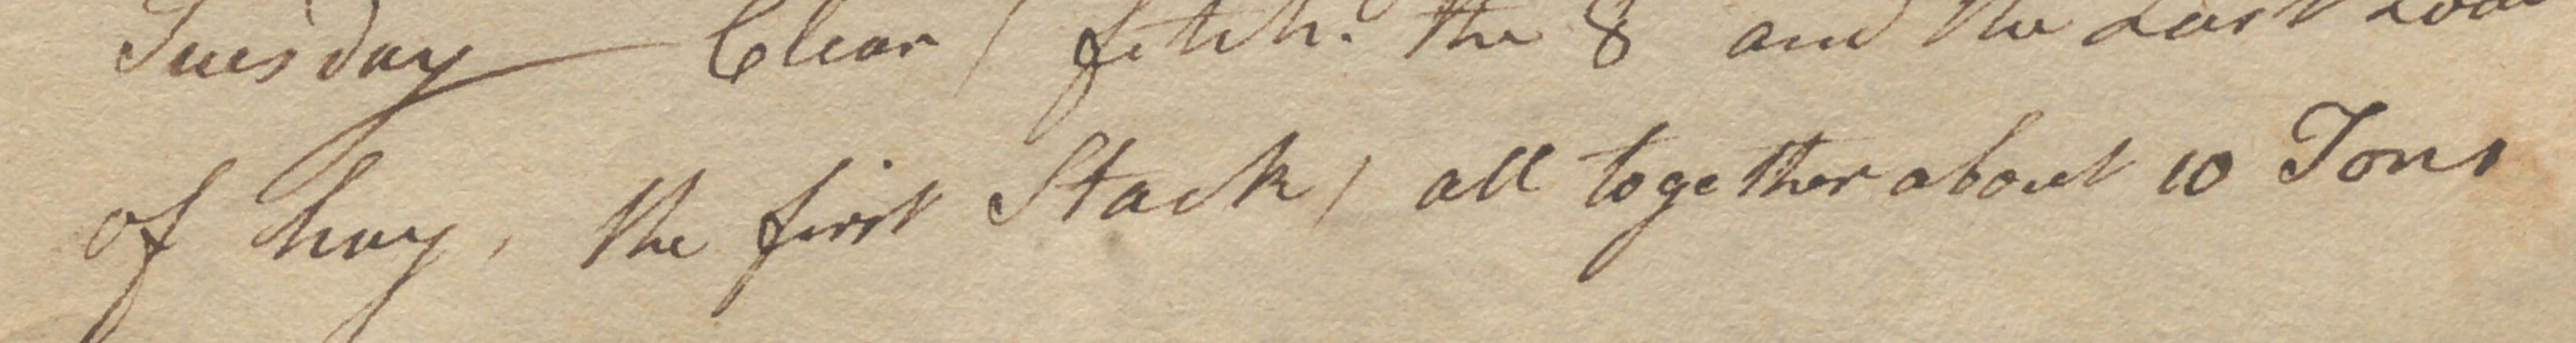of Teuy, the first Stack, all together about 10 Tons
